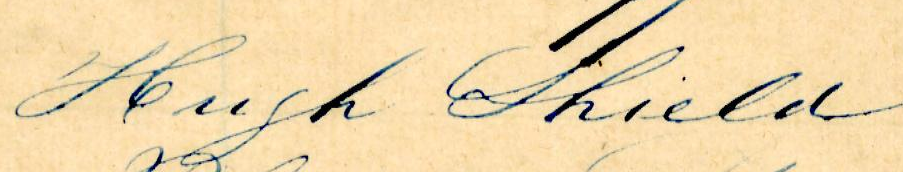Hugh Shield
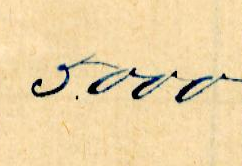5.000
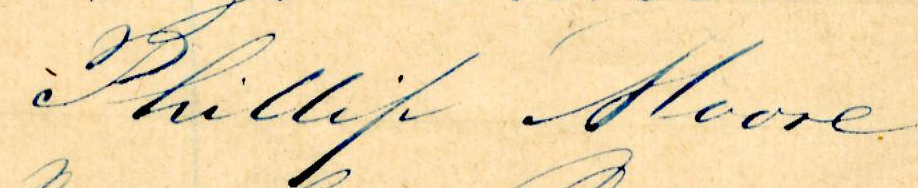Phillip Moore
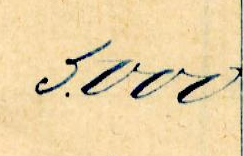5.000
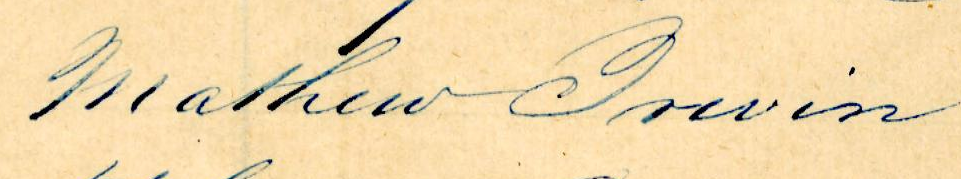Matthew Irwin
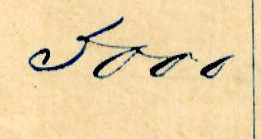5000
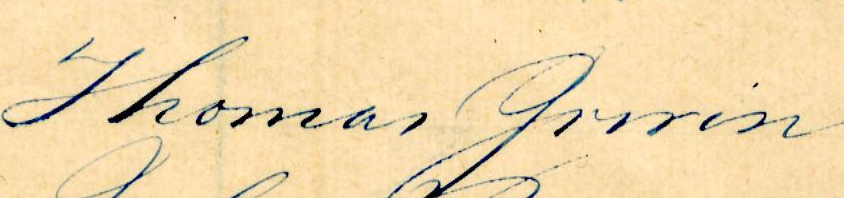Thomas Irwin
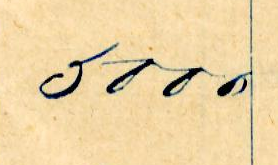5000
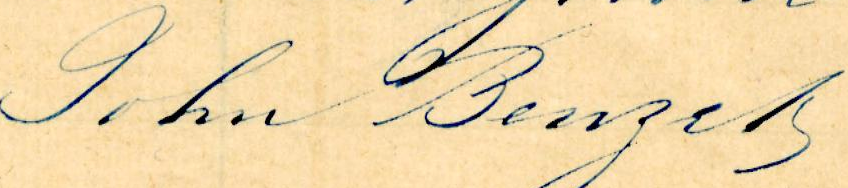John Benzet
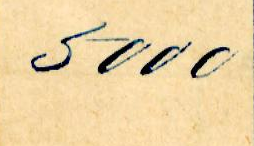5000
